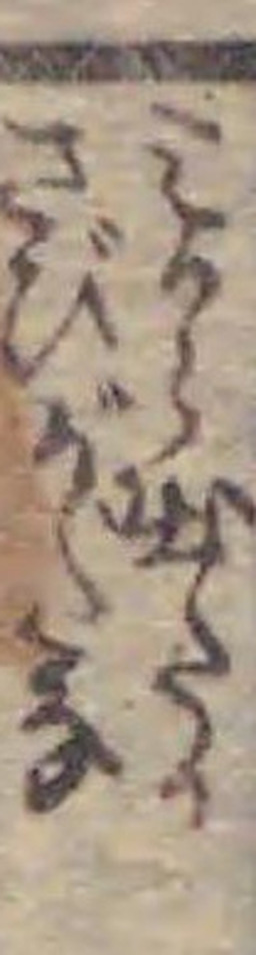さびがたな
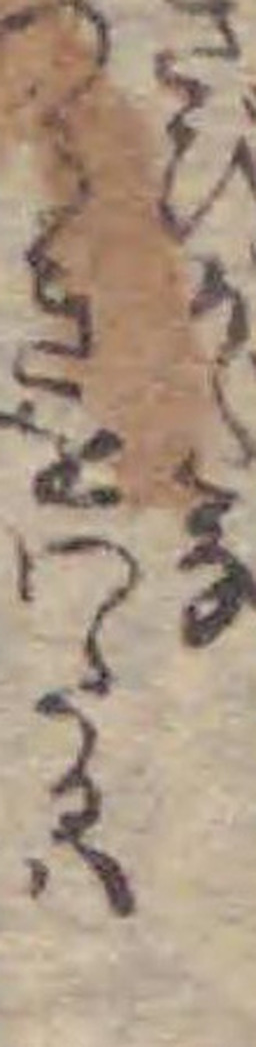つるきをわたるは
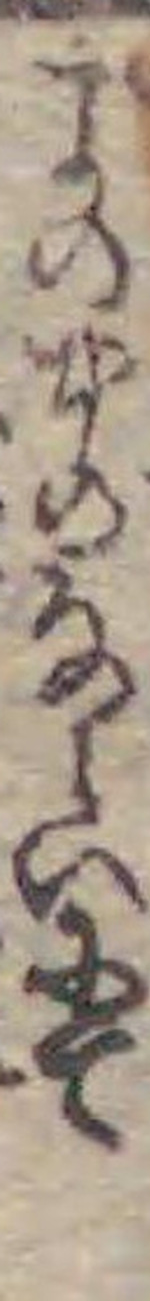よの中のならいにて
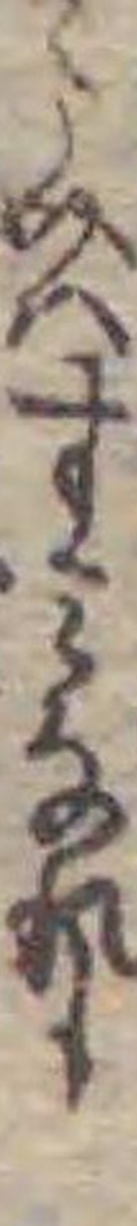太郎介はすみなれし
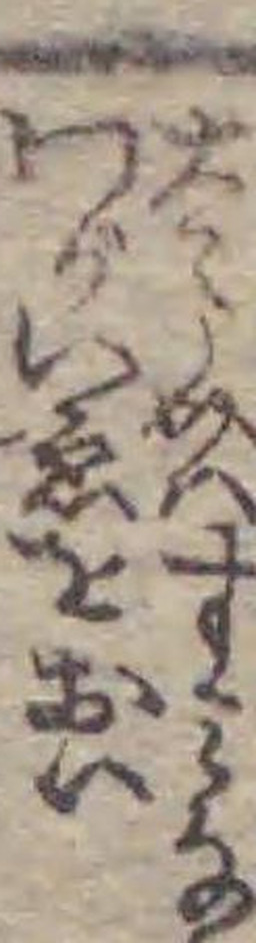わがいゑをおい
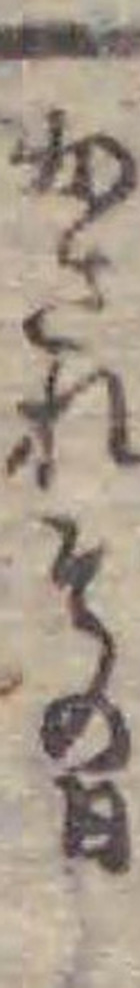出されその日
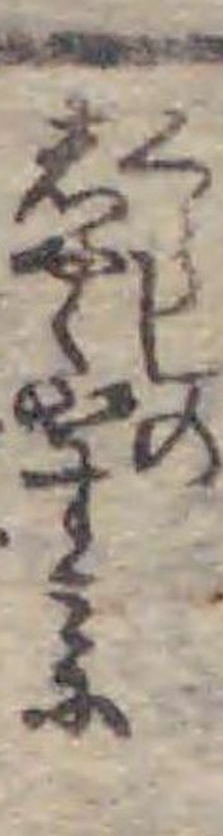しやくやすみに
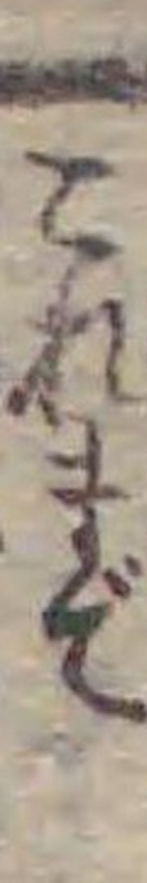これまで
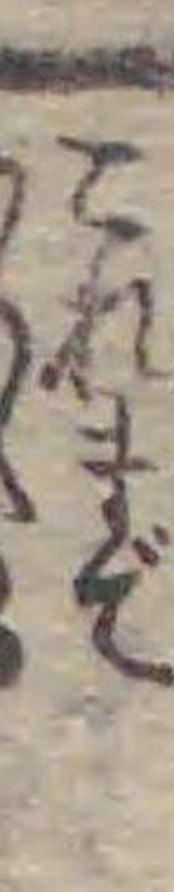これまで
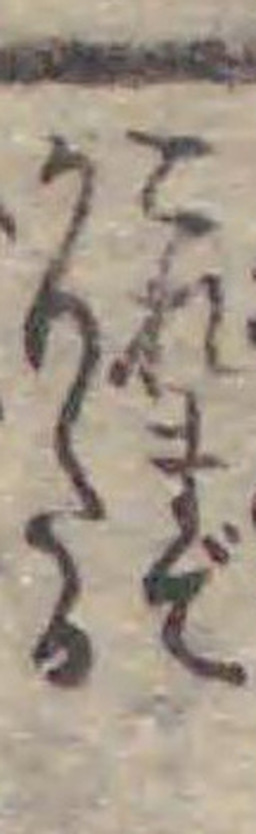かりたる
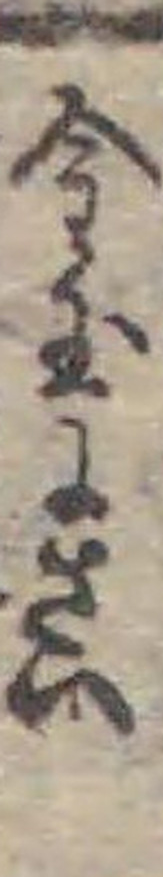金玉にさい
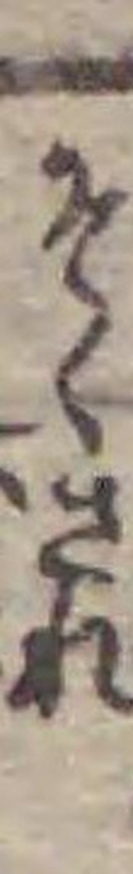そくされ
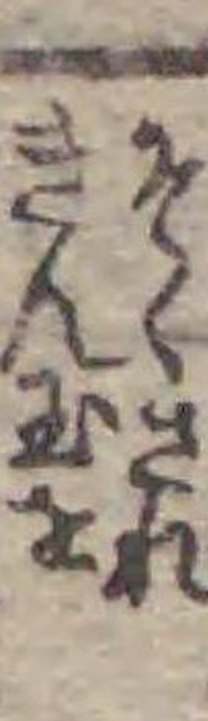きん玉を
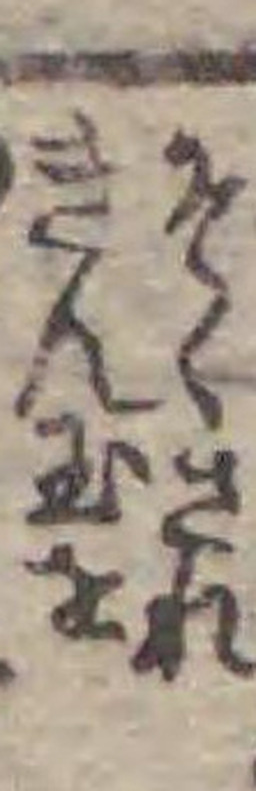きん玉を
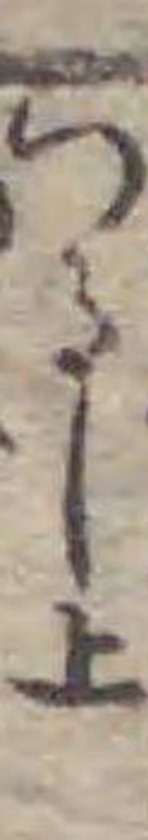つるし上
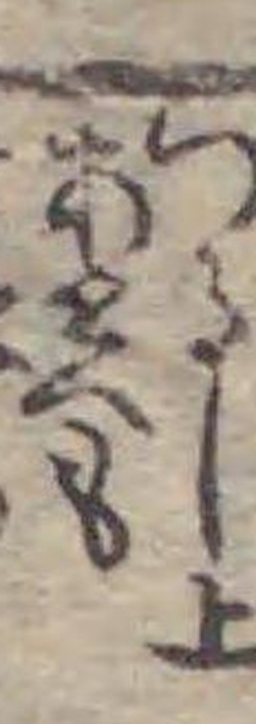あとへも
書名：四遍搨心学草帋 : 3巻
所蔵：国立国会図書館 National Diet Library, JAPAN
